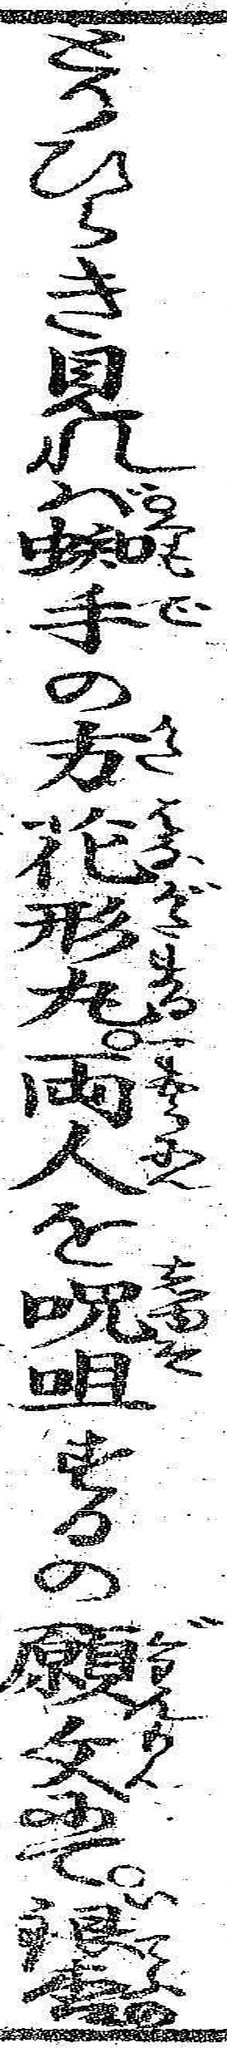とりひらき見れば。蜘手の方花形丸。両人を呪咀するの願文にて。銀杏
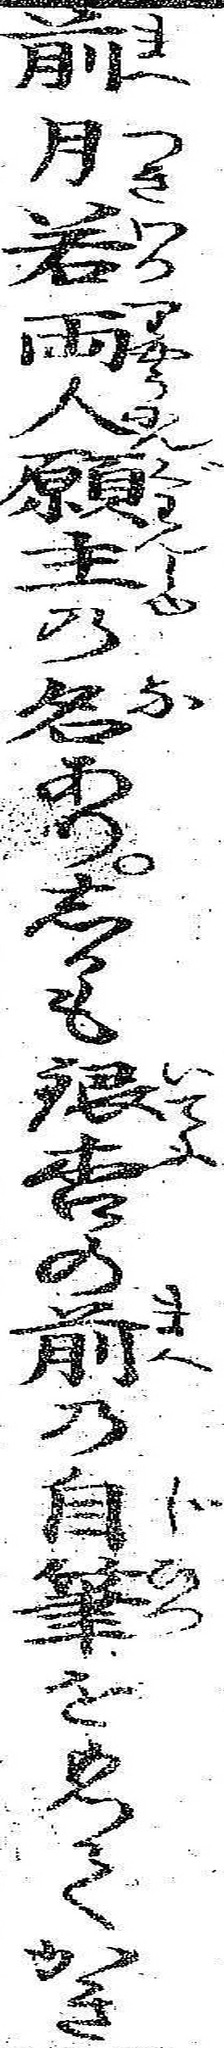前月若両人願主の名あり。しかも銀杏の前の自筆をもつてかき
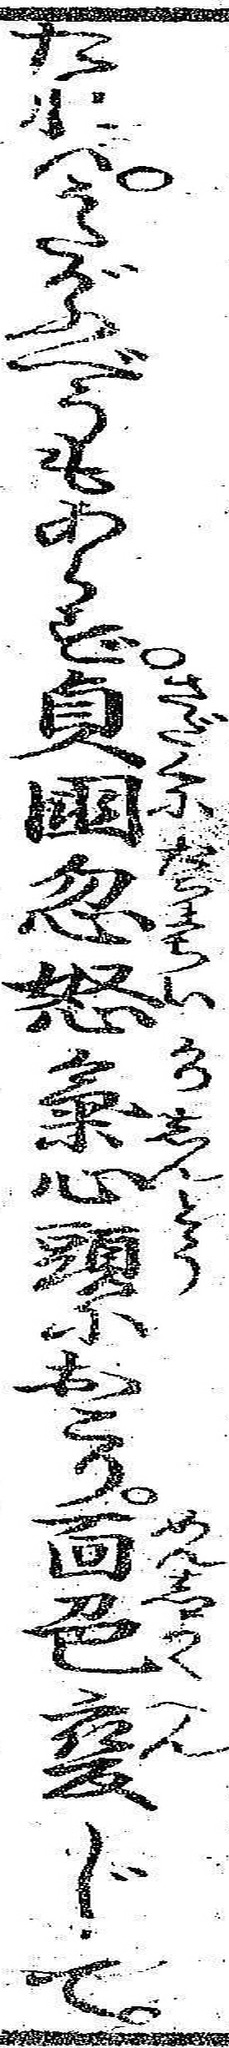たれば。うたがふべうもあらず。貞国忽怒気心頭におこり。面色変じて。
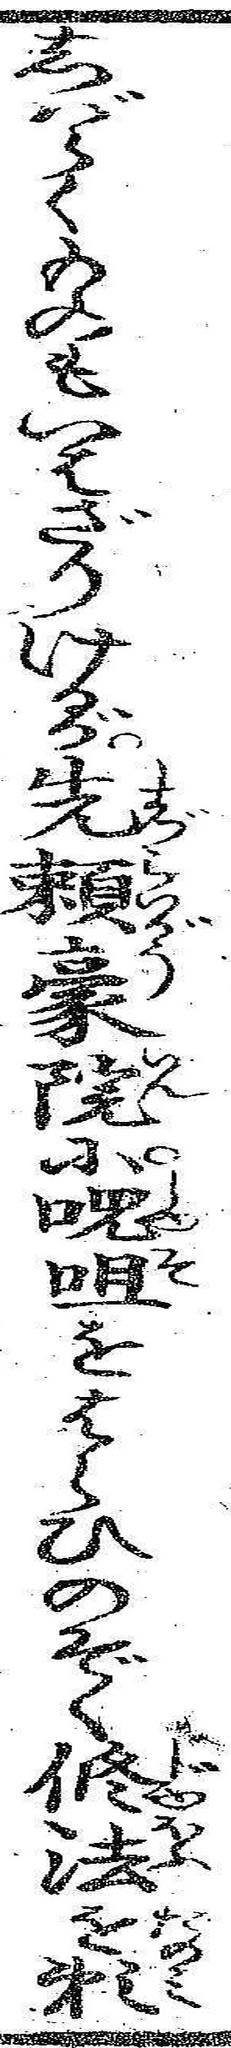しばらくものもいはざりけるが。先頼豪院に。呪咀をはらひのぞく修法を頼
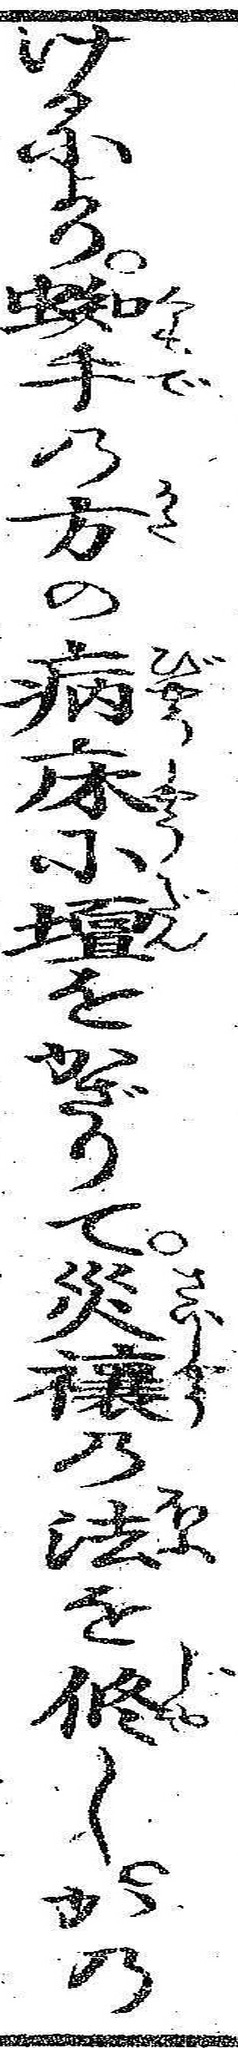けるにより。蜘手の方の病症に壇をかざりて。災禳の法を修し。かの
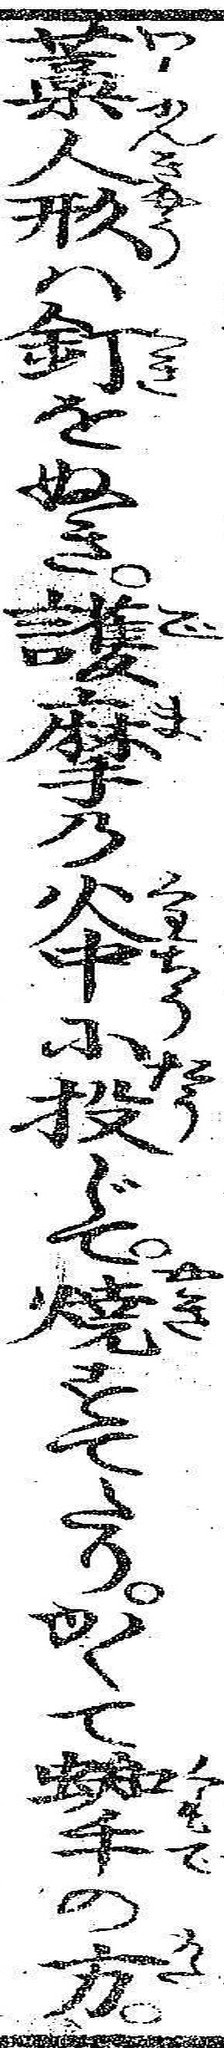藁人形は釘をぬき。護摩の火中に投じて。焼すてたり。かくて蜘手の方。
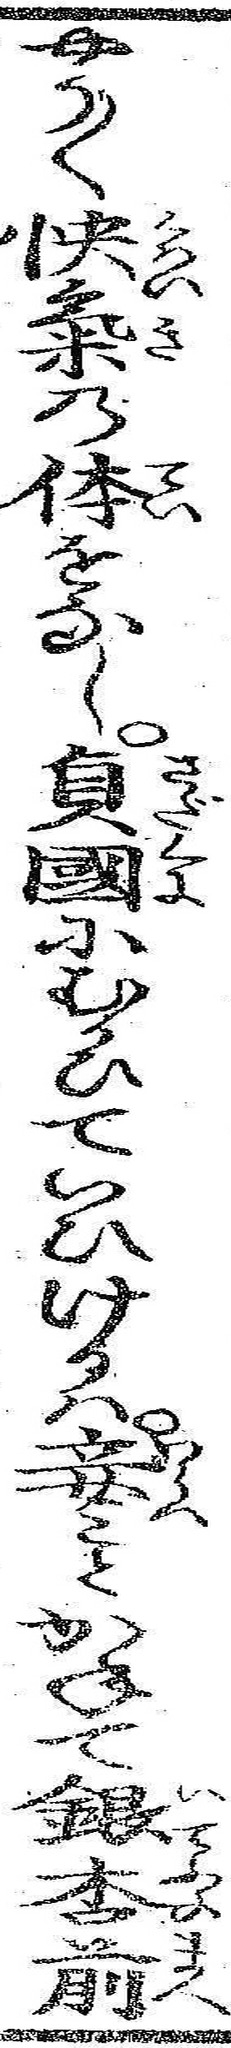やう〳〵快気の体をなし。貞国にむかひていひけるは。妾ことかねて銀杏前
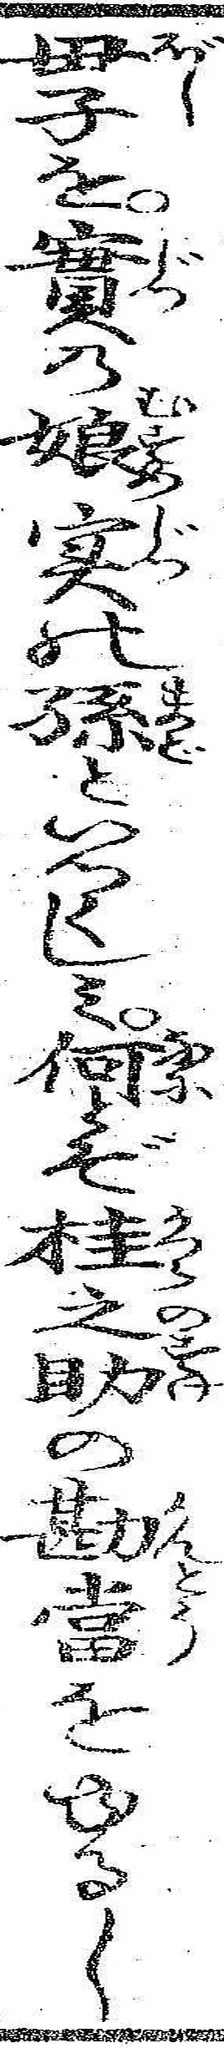母子を。実の娘実の孫といつくしみ。何とぞ桂之助の勘当をゆるし
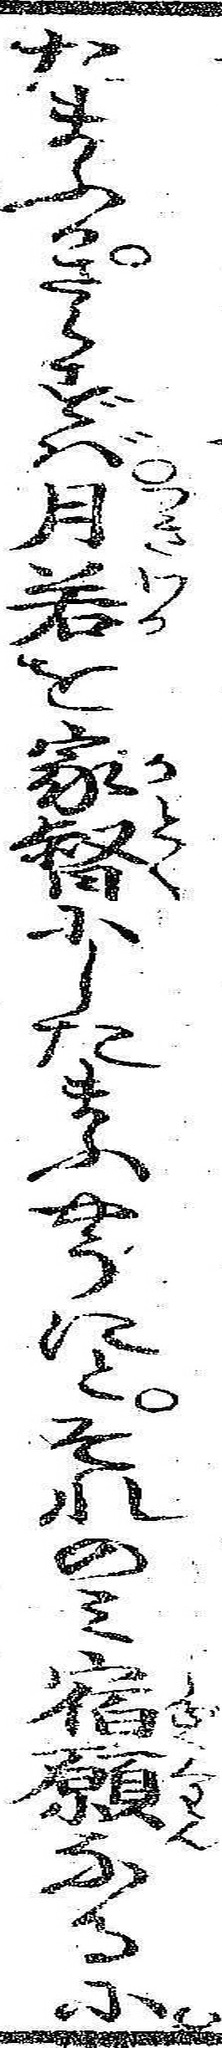たまふか。さらずば。月若を家督にしたまふやうにと。それのみ宿願なるに。
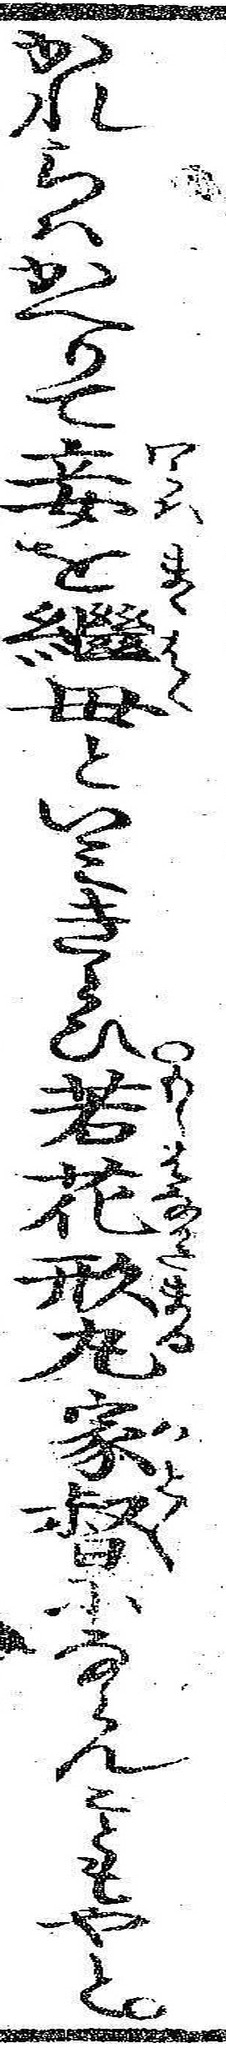かれらはかへりて妾を継母といみきらひ。若花形丸家督にならんこともやと。
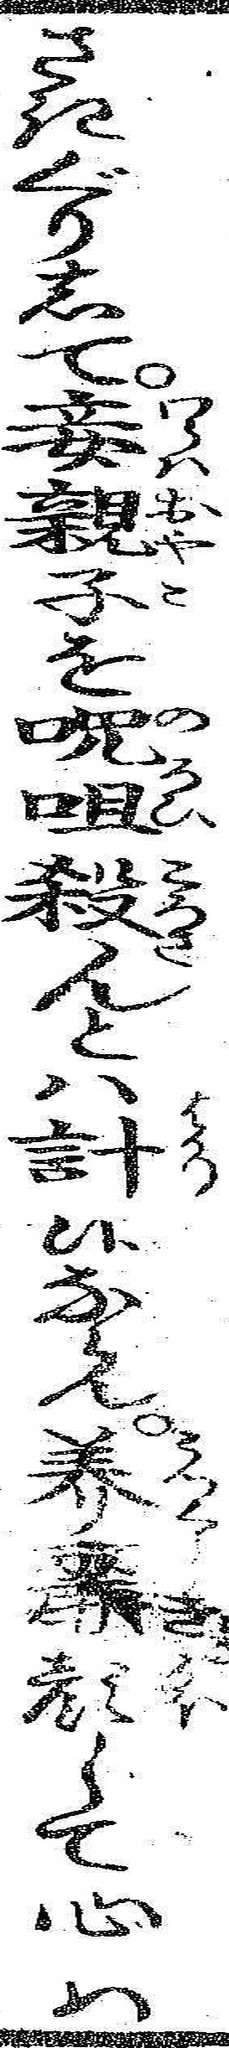さきぐりして。妾親子を呪咀殺んとは計候ならん。美麗顔して心は
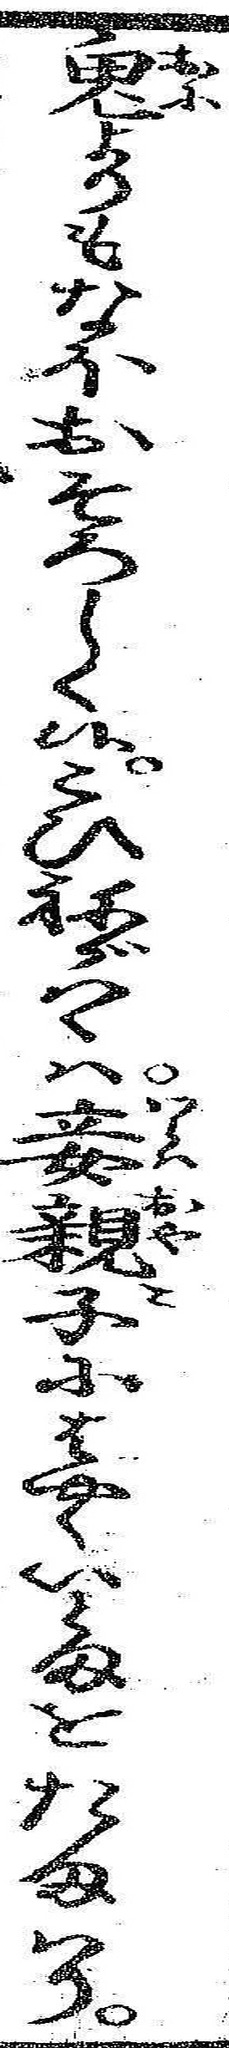鬼よりもなほおそろしく候。こひねがはくは。妾親子にはやくいとまをたまはり。
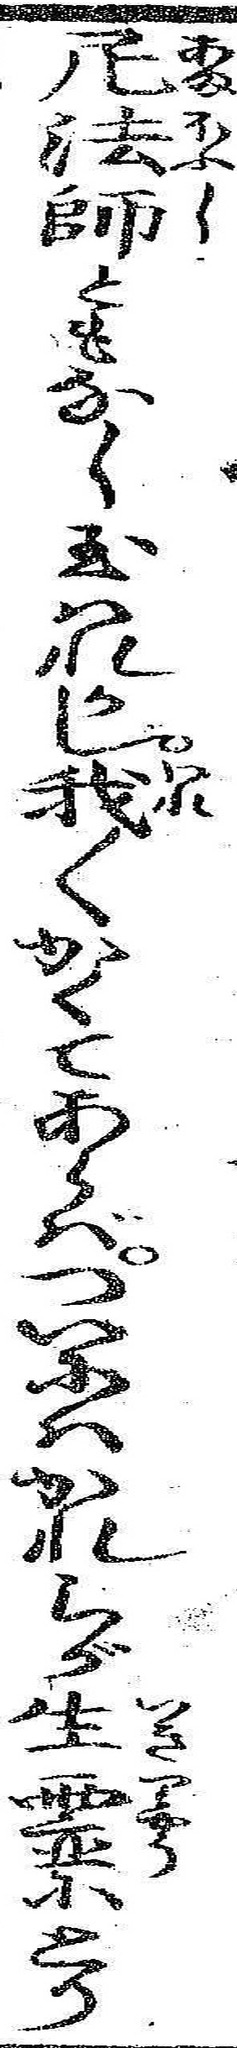尼法師ともなし玉はれかし。我々かくてあらば。ついにはかれらが生霊にとり
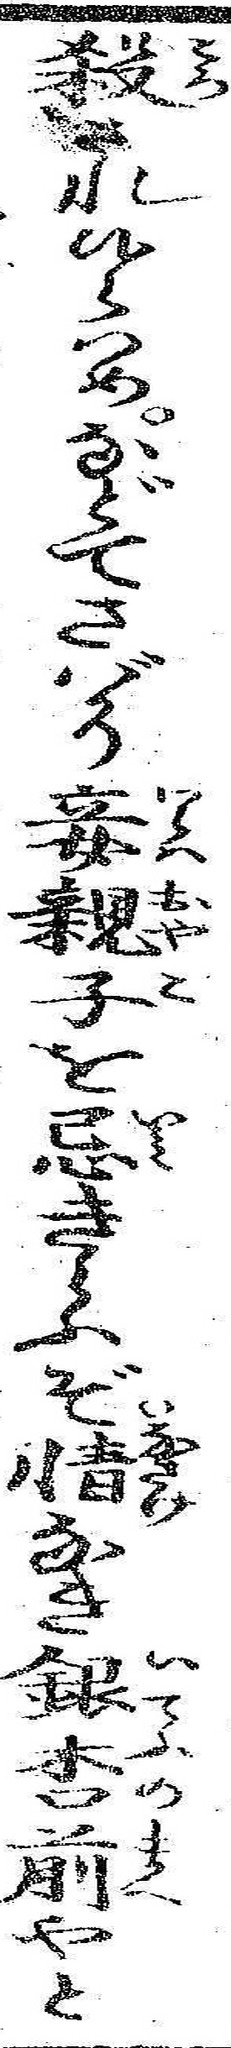殺され候らはめ。などてさばかり妾親子を忌きらふぞ。情なき銀杏前やと
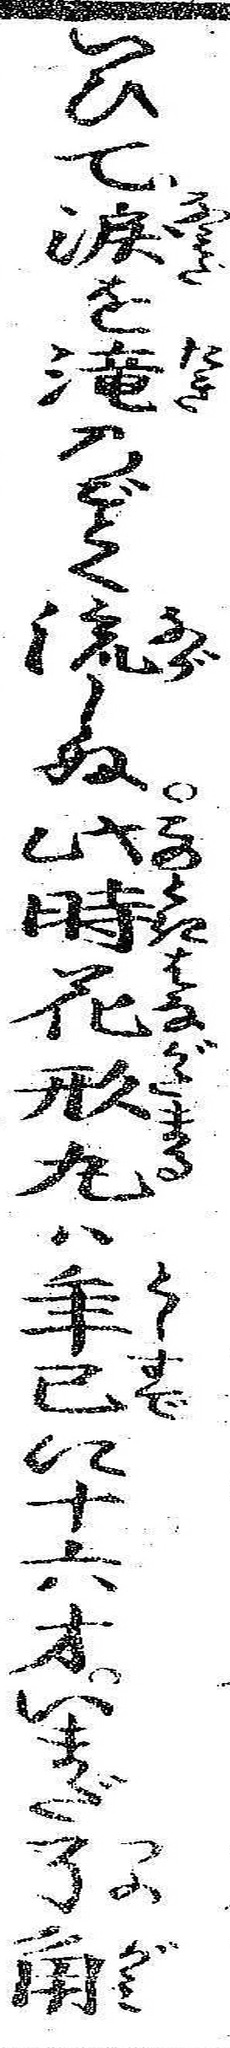いひて。涙を滝のごとく流しぬ。此時花形丸は年已に十六才。いまだ了角
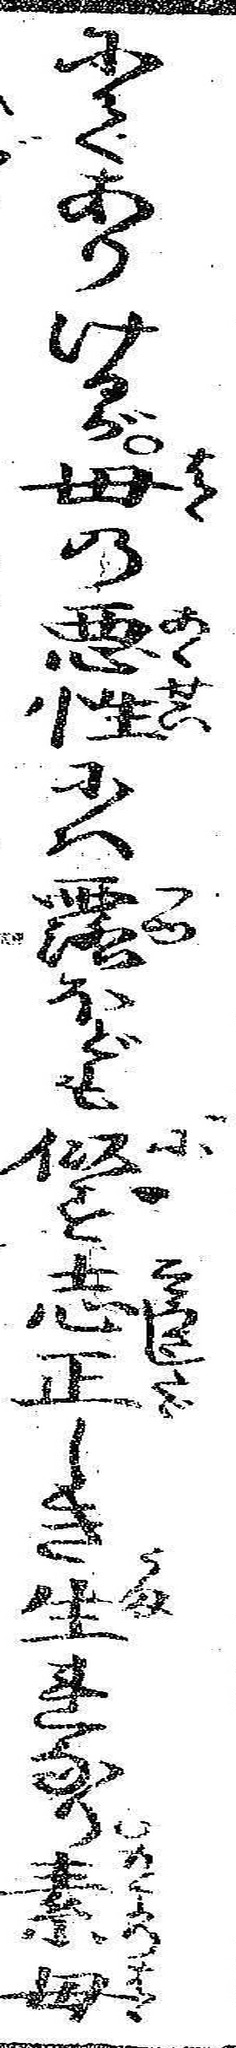にてありけるが。母の悪性には露ほども似ず志正しき生れなり。素母
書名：昔話稲妻表紙
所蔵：国文学研究資料館
